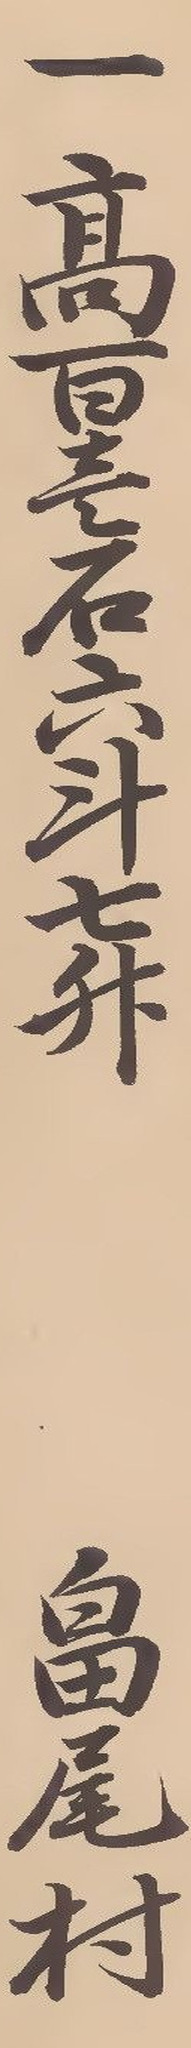一高百壱石六斗七升畠尾村
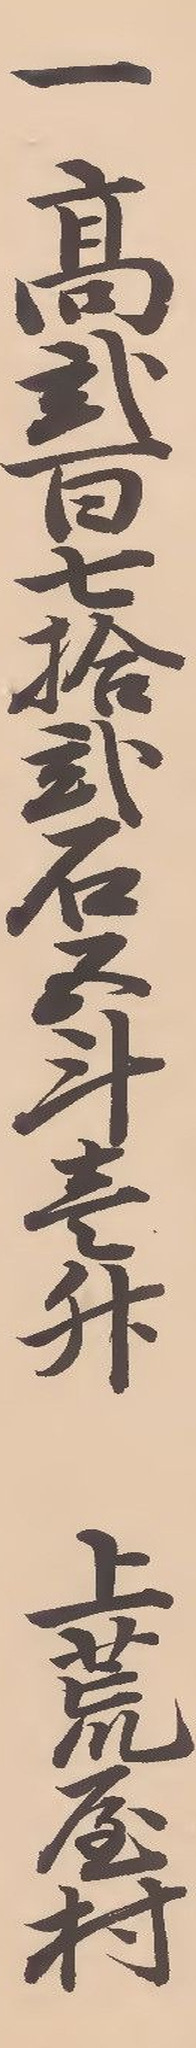一高弐百七拾弐石五斗壱升上荒屋村
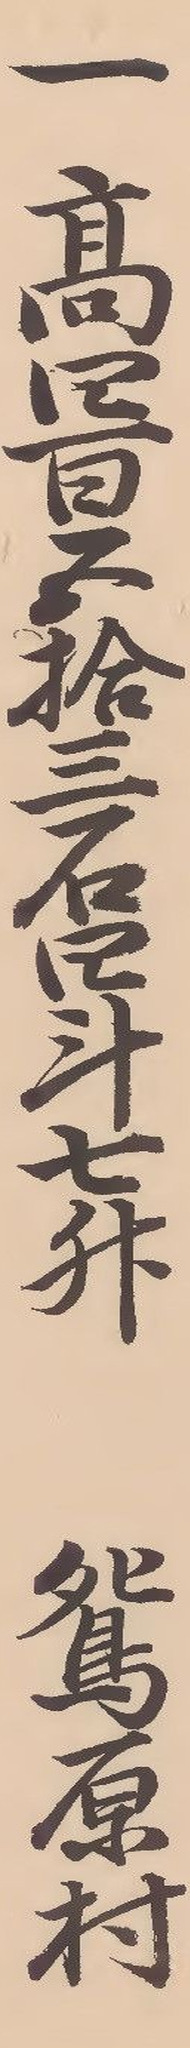一高四百五拾三石四斗七升鴛原村
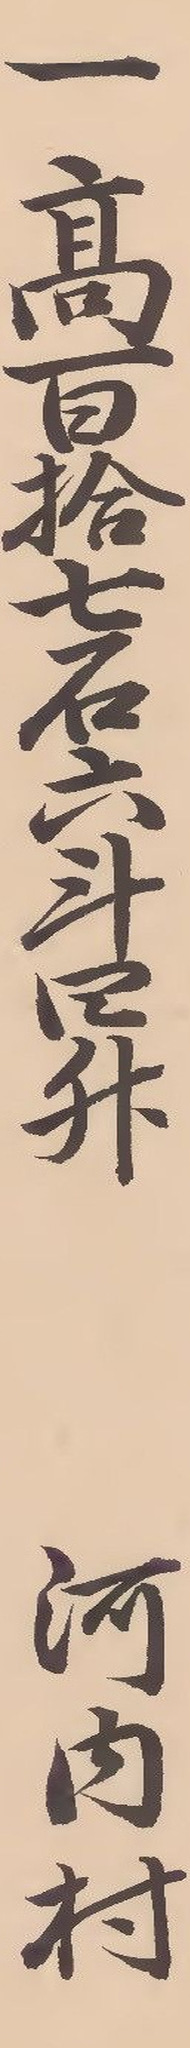一高百拾七石六斗四升河内村
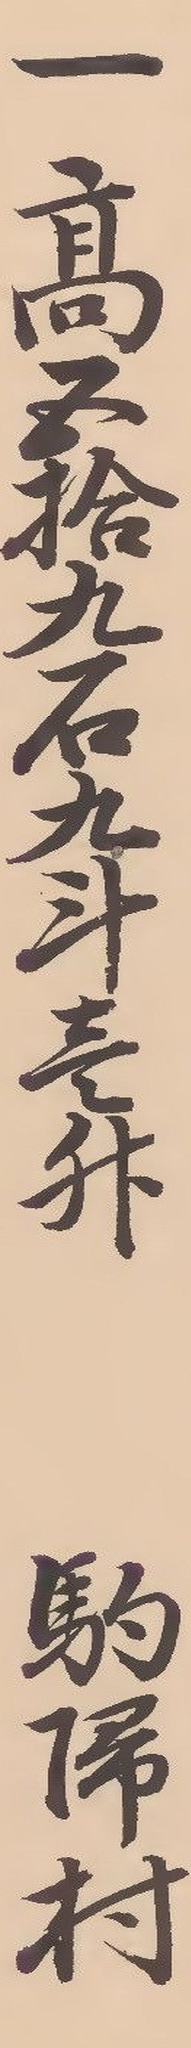一高五拾九石九斗壱升駒帰村

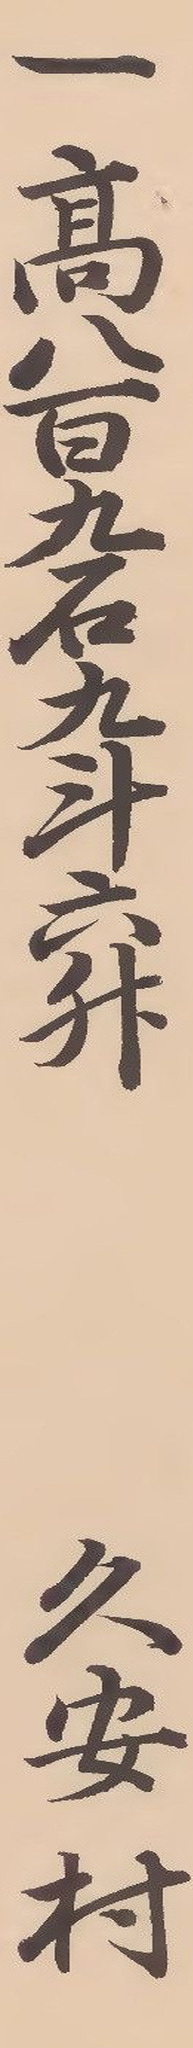一高八百九石九斗六升久安村
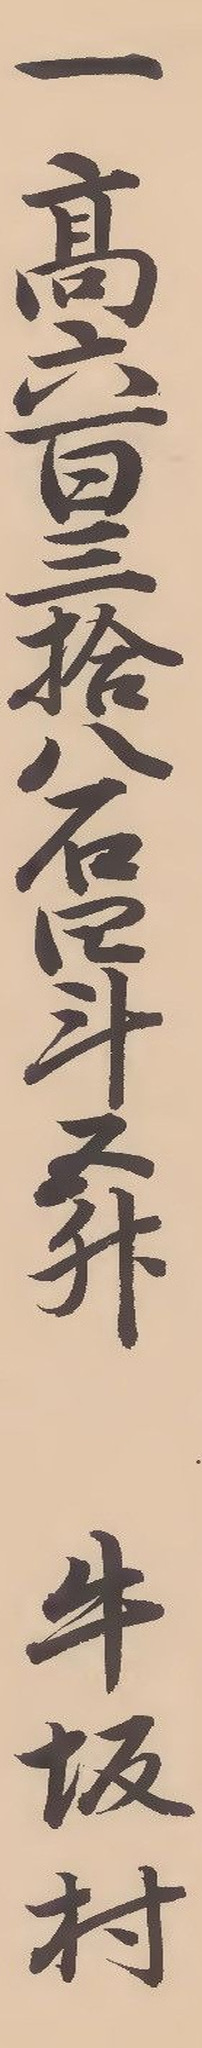一高六百三拾八石四斗五升牛坂村
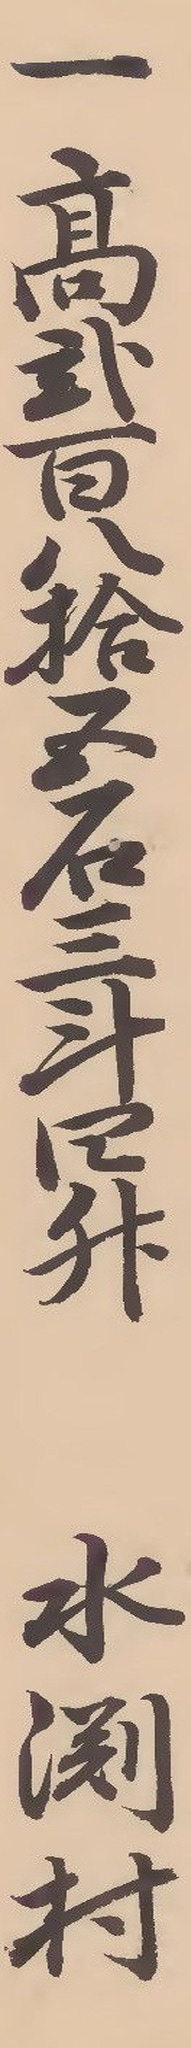一高弐百八拾五石三斗四升水淵村

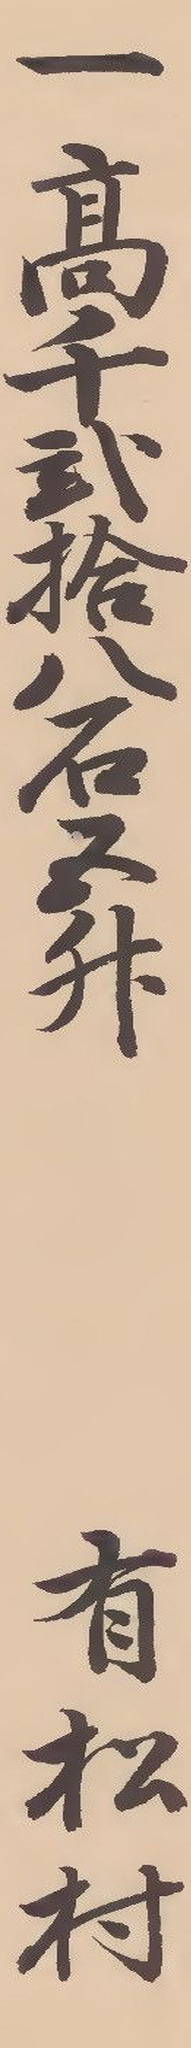一高千弐拾八石五升有松村
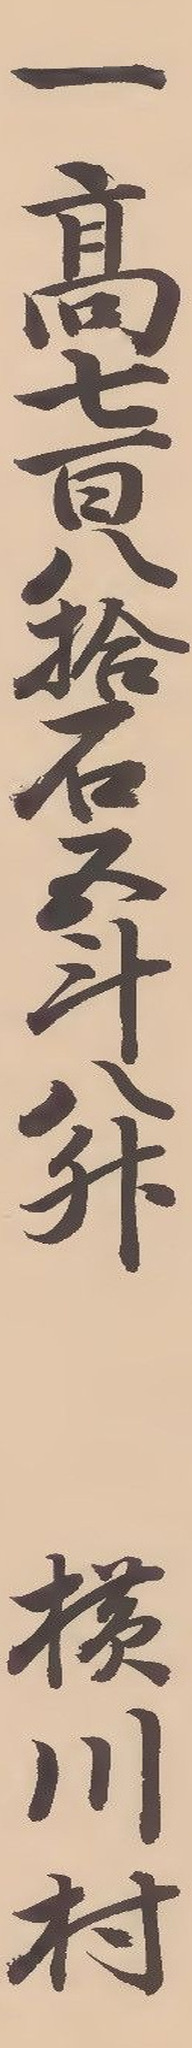一高七百八拾石五斗八升横川村
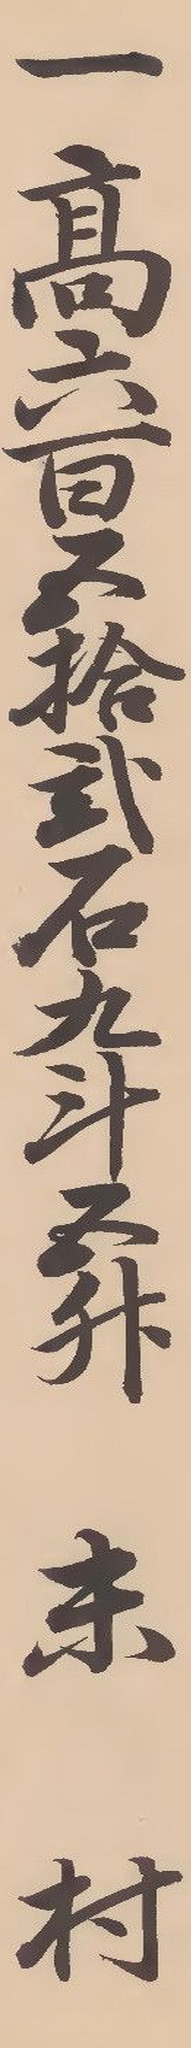一高六百五拾弐石九斗五升末村
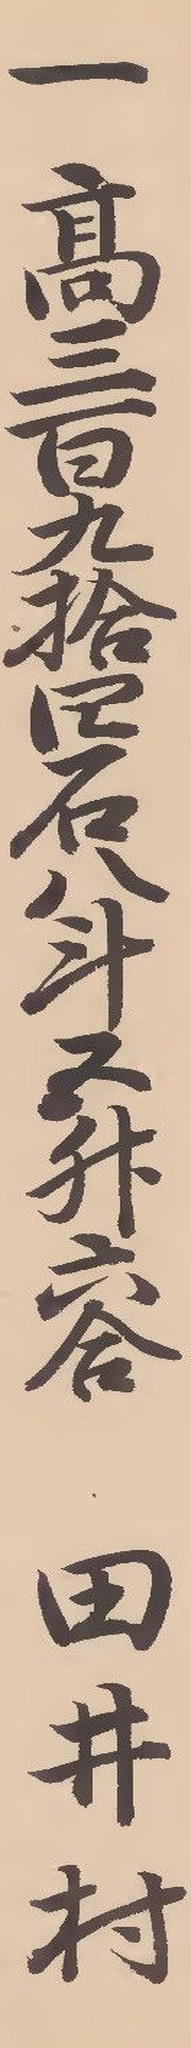一高三百九拾四石八斗五升六合田井村
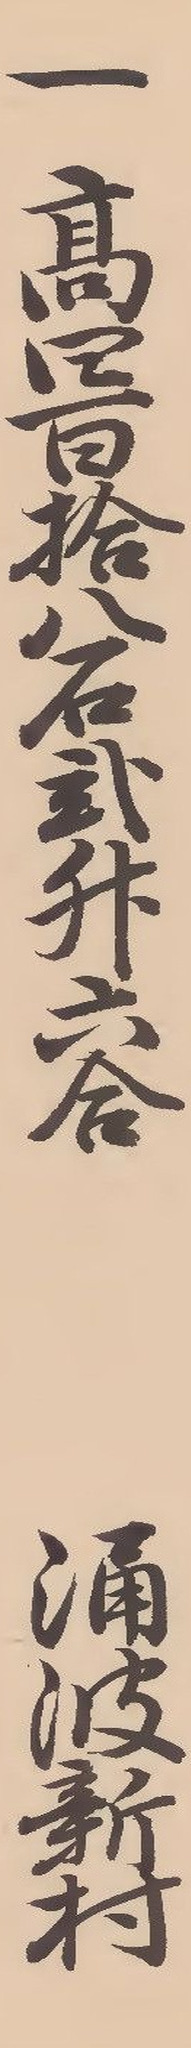一高四百拾八石弐升六合涌波新村
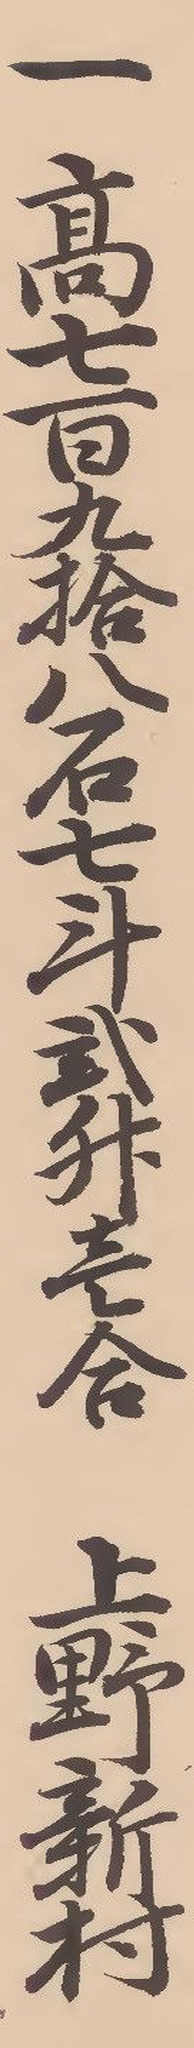一高七百九拾八石七斗弐升壱合上野新村
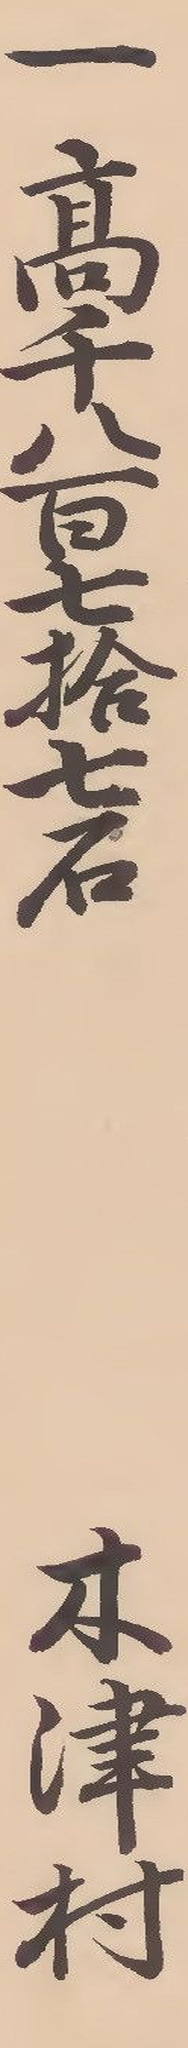一高千八百七拾七石木津村

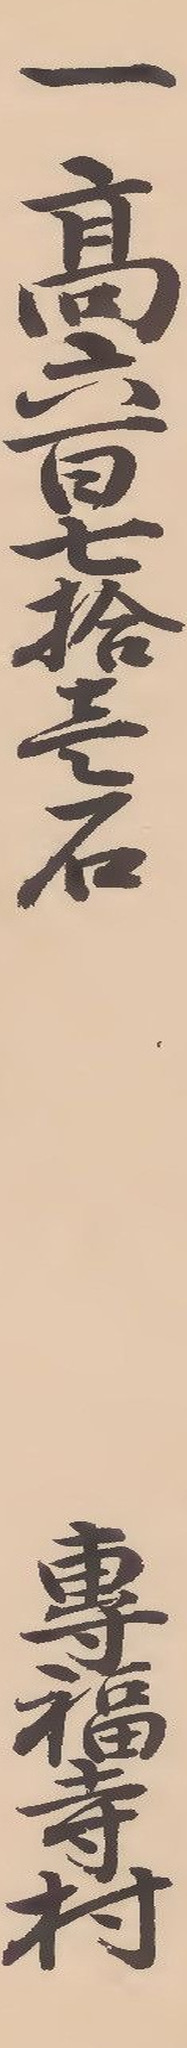一高六百七拾壱石専福寺村
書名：加賀国郷帳
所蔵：国立公文書館 National Archives of Japan
